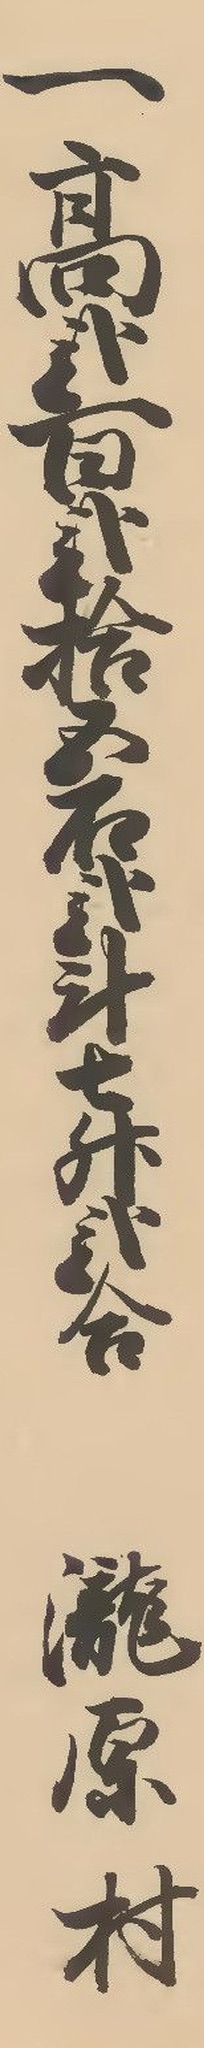一高弐百弐拾五石弐斗七升弐合滝原村

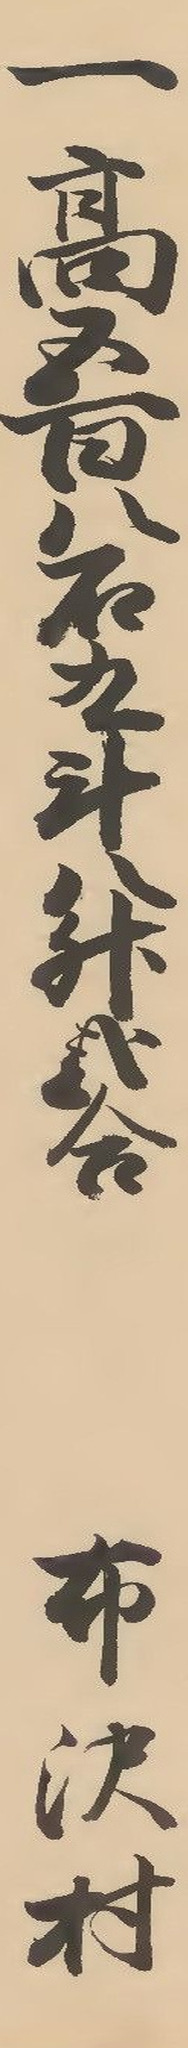一高五百八石九斗八升弐合布沢村
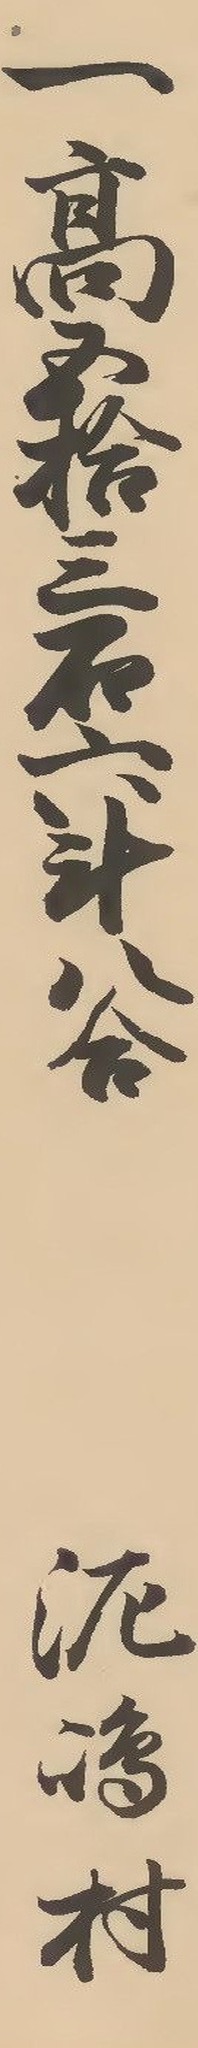一高五拾三石六斗八合泥島村
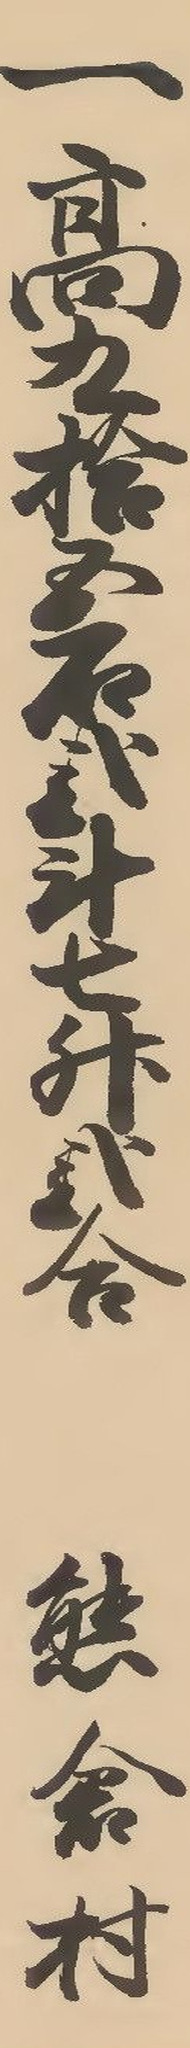一高九拾五石弐斗七升弐合熊倉村
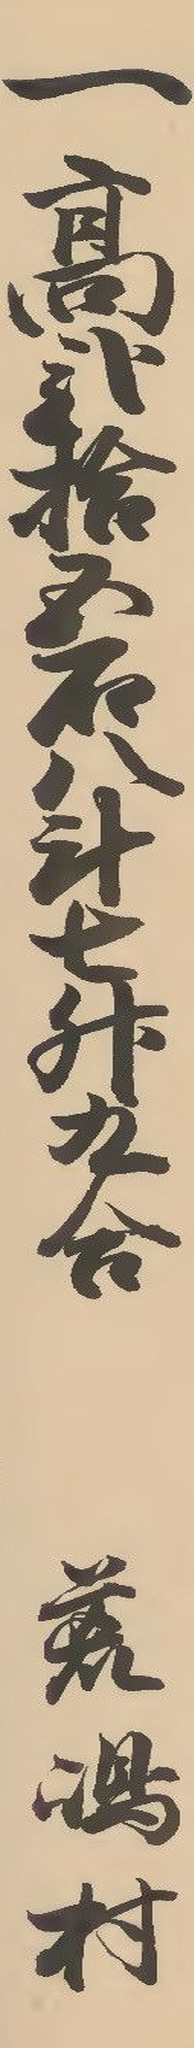一高弐拾五石八斗七升九合荒島村
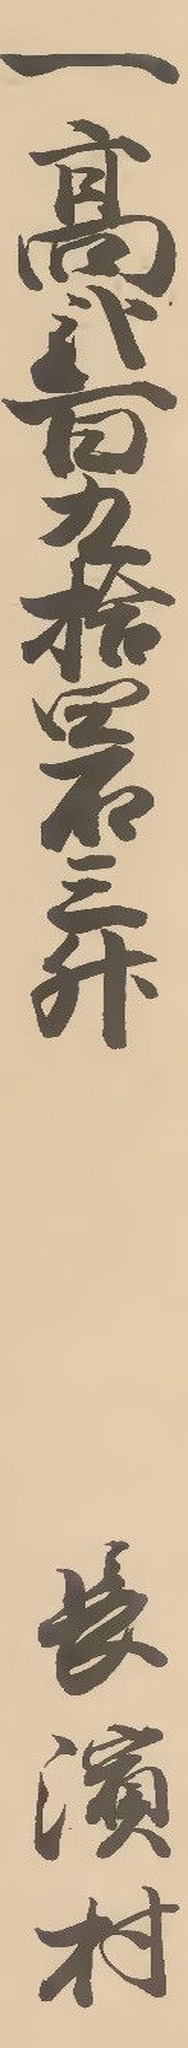一高弐百九拾四石三升長浜村
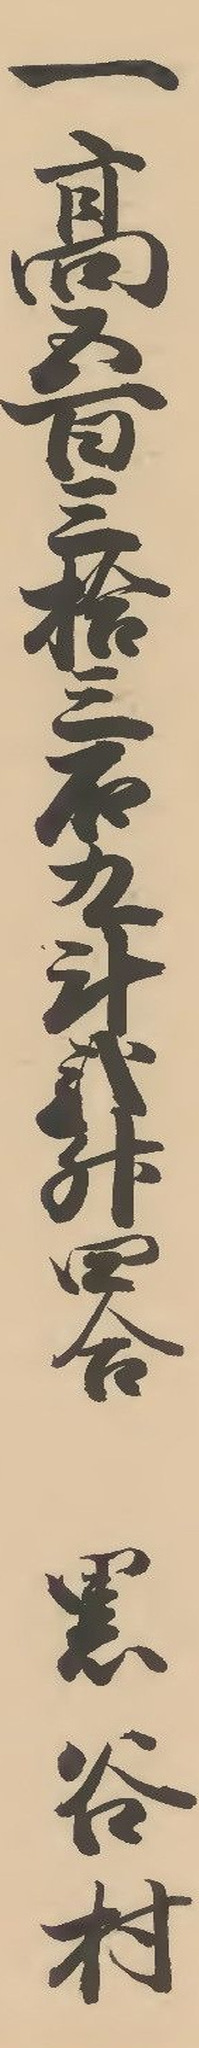一高五百三拾三石九斗弐升四合黒谷村
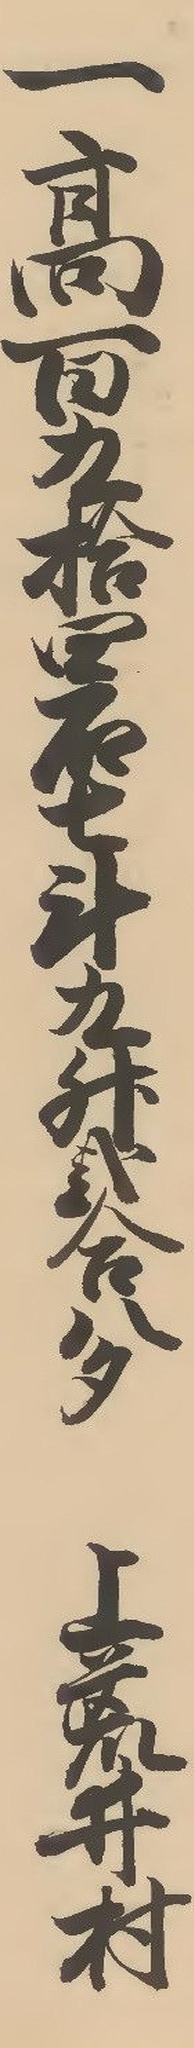一高百九拾四石七斗九升弐合八勺上荒井村
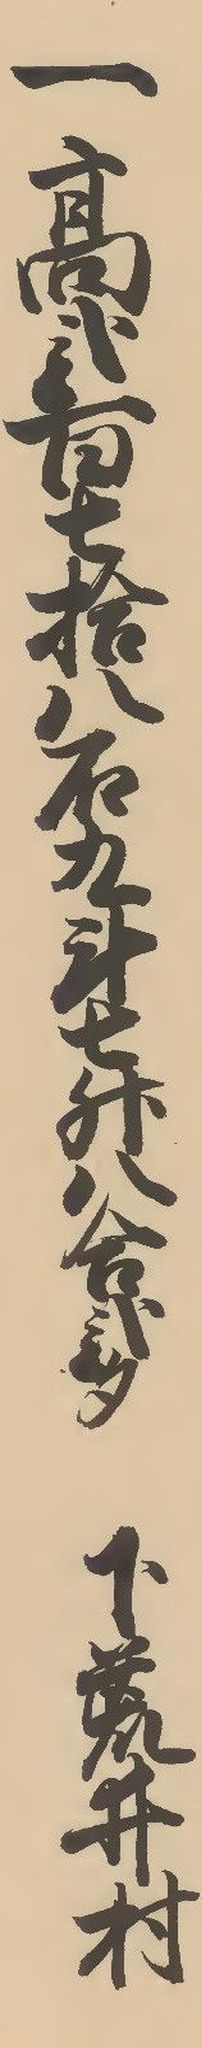一高弐百七拾八石九斗七升八合弐勺下荒井村

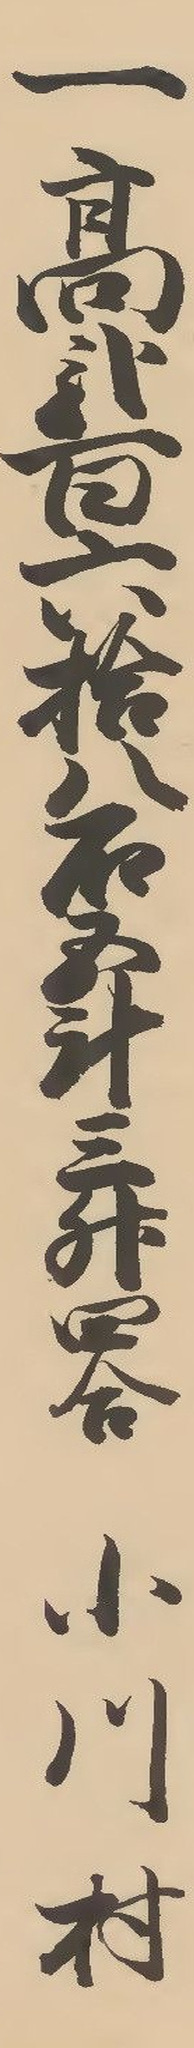一高弐百六拾八石五斗三升四合小川村
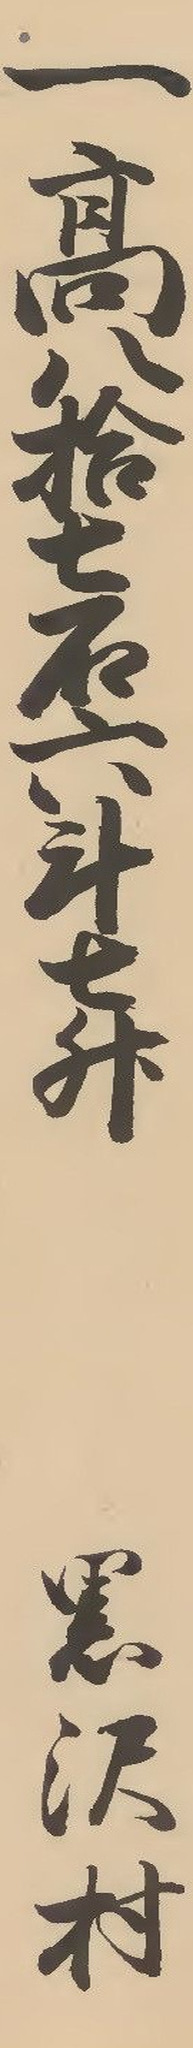一高八拾七石六斗七升黒沢村
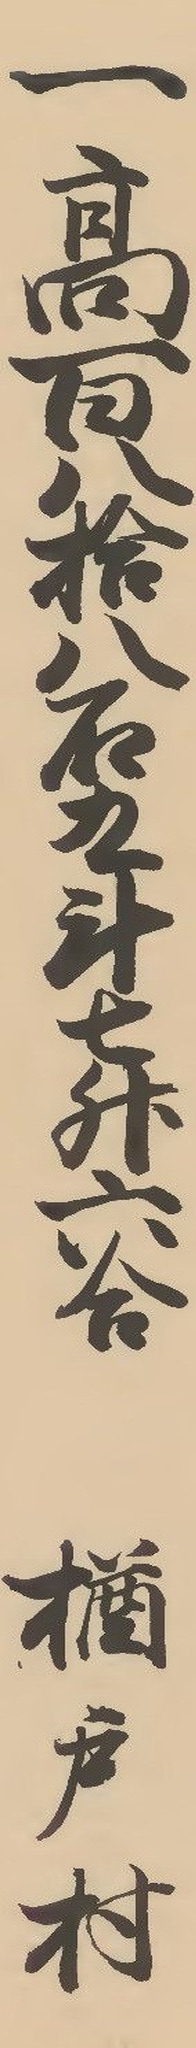一高百八拾八石九斗七升六合楢戸村
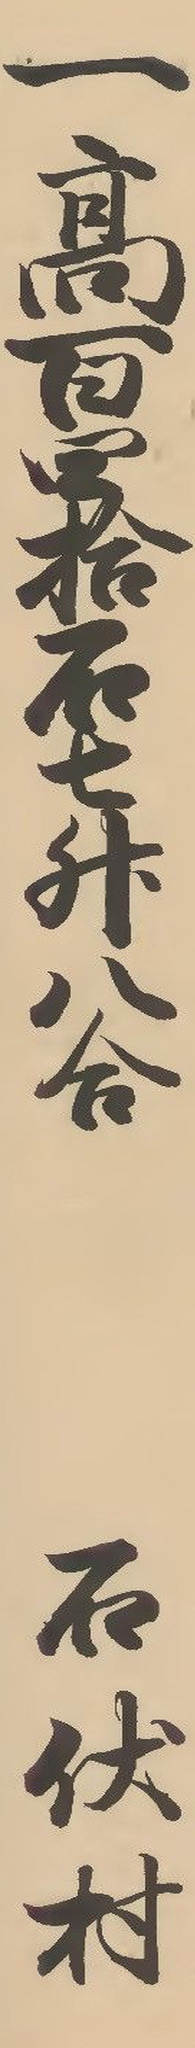一高百四拾石七升八合石伏村
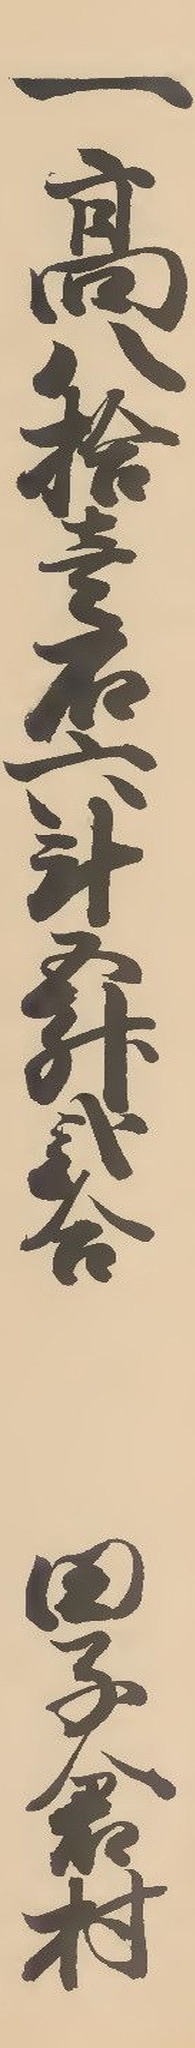一高八拾壱石六斗五升弐合田子倉村
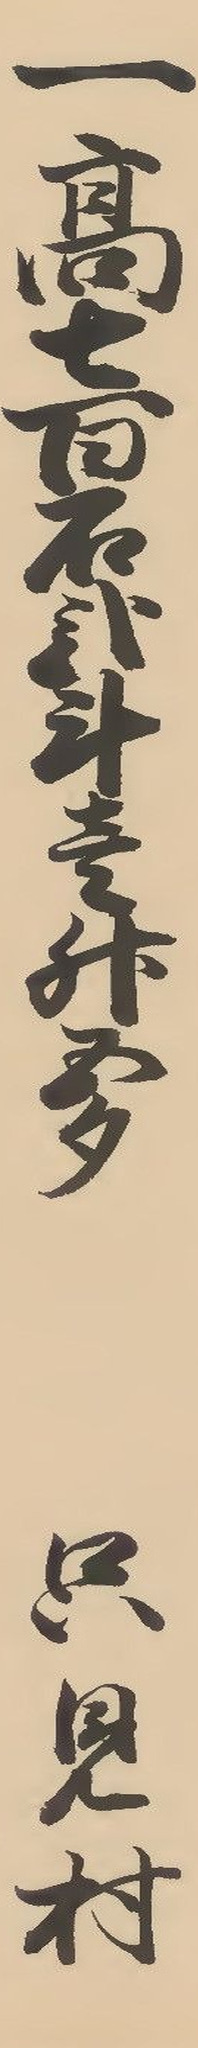一高七百石弐斗壱升五勺只見村
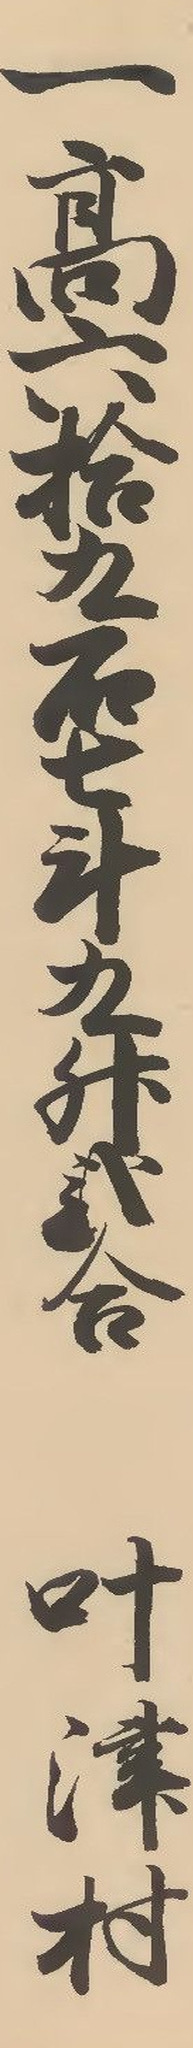一高六拾九石七斗九升弐合叶津村
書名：陸奥国郷帳　１
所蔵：国立公文書館 National Archives of Japan
